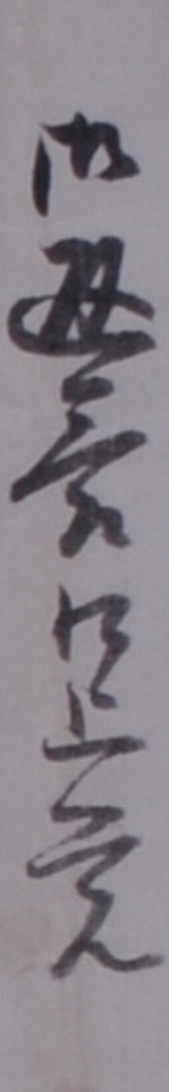御返答口上覚
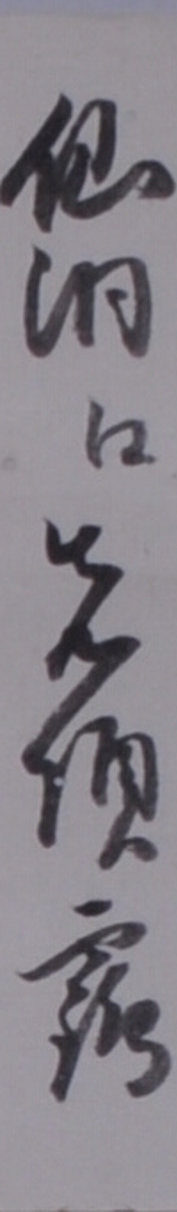仙洞え先頃靏
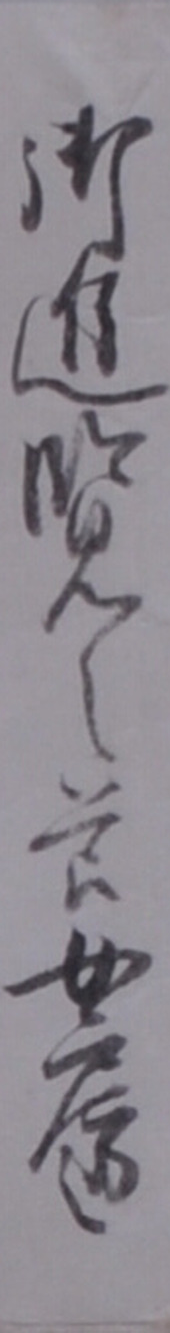御進覧之節女房之
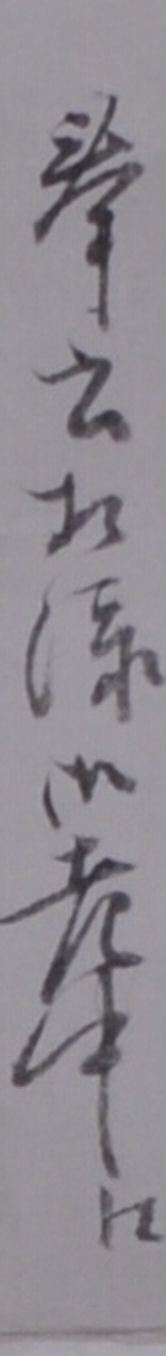奉書相添御老中え
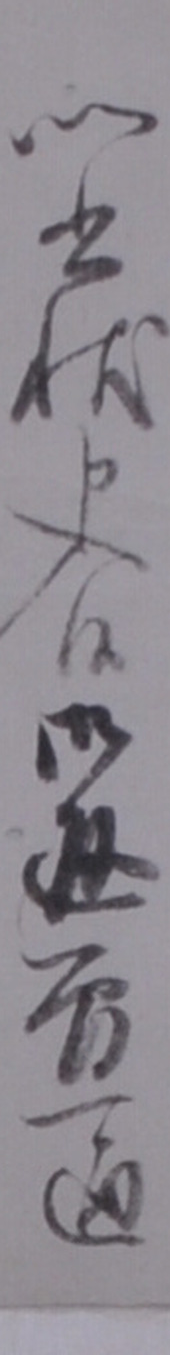以書状申入候御返簡一通
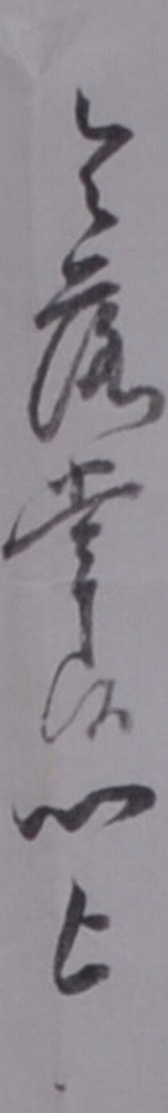令落掌候以上
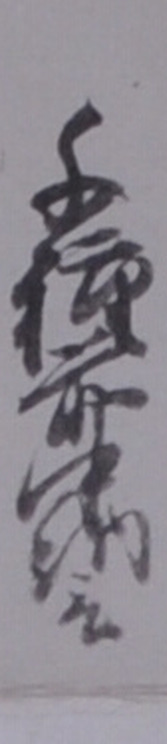千種前中納言
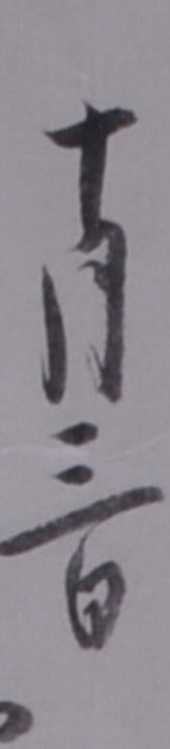十月三日
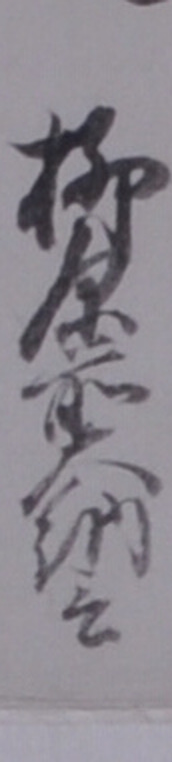柳原前大納言
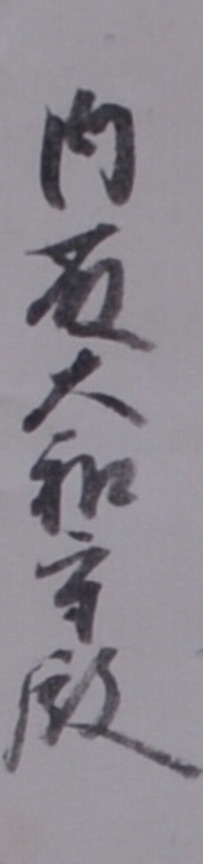内藤大和守殿
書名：御返答口上覚
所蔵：伊那市立高遠町図書館・合同会社AMANE
